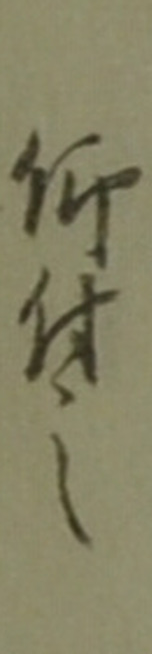仰付之
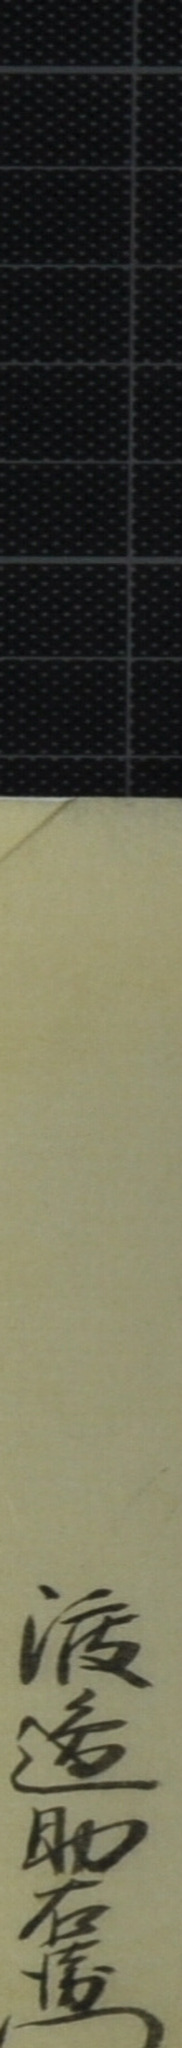渡邊助右衛門
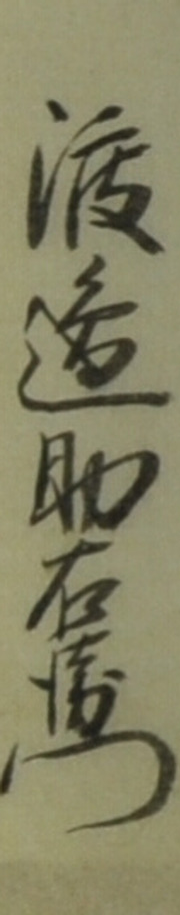渡邊助右衛門

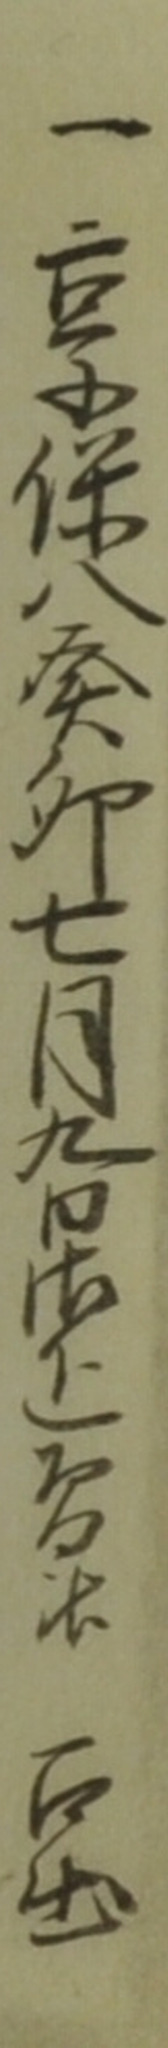一享保八癸卯七月九日御近習被召出
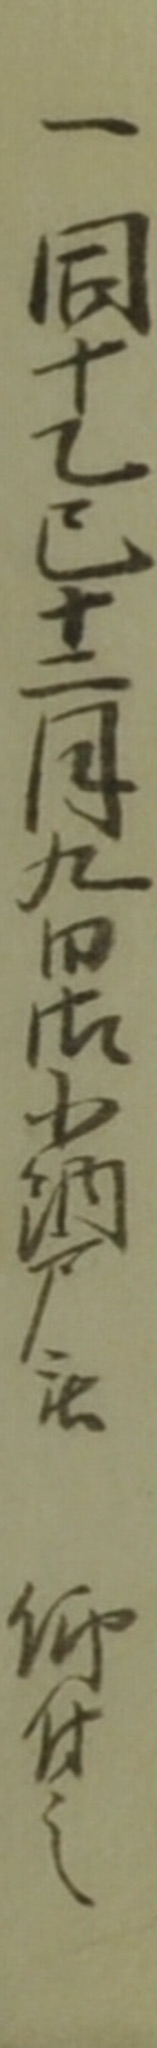一同十乙巳十二月九日御小納戸被仰付之
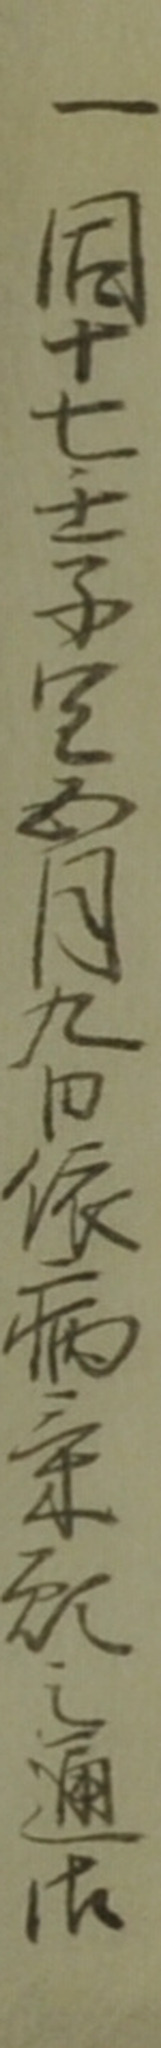一同十七壬子閏五月九日依病気願之通御
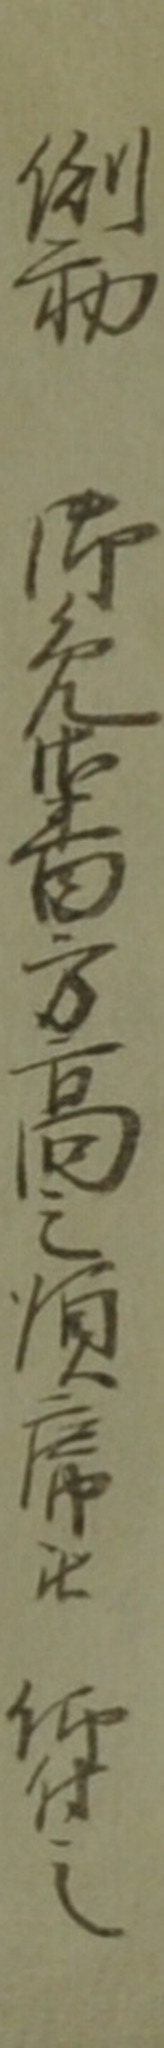側勤御免御番方高之順席被仰付之
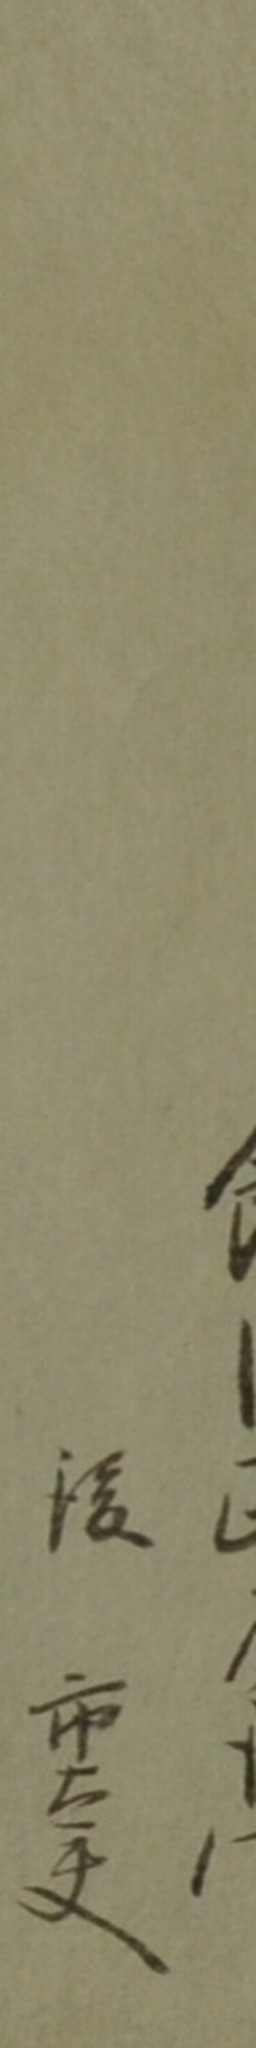後市太夫
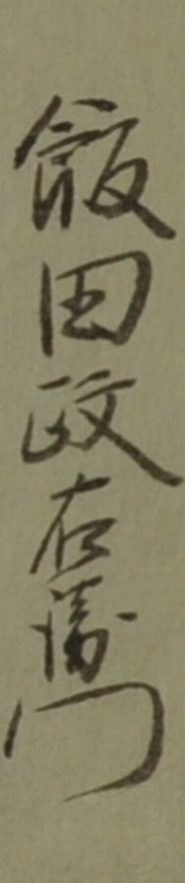飯田政右衛門
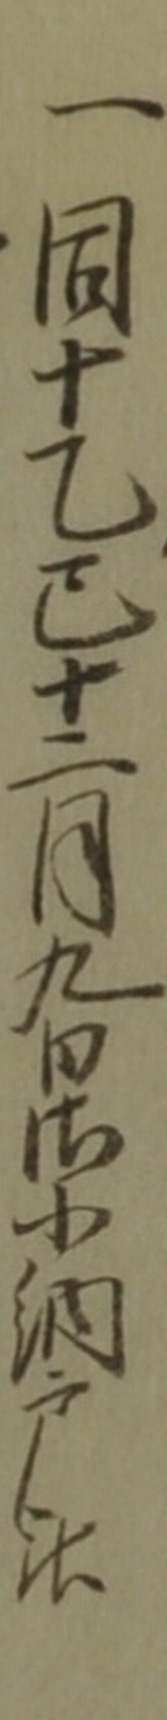一同十乙巳十二月九日御小納戸被
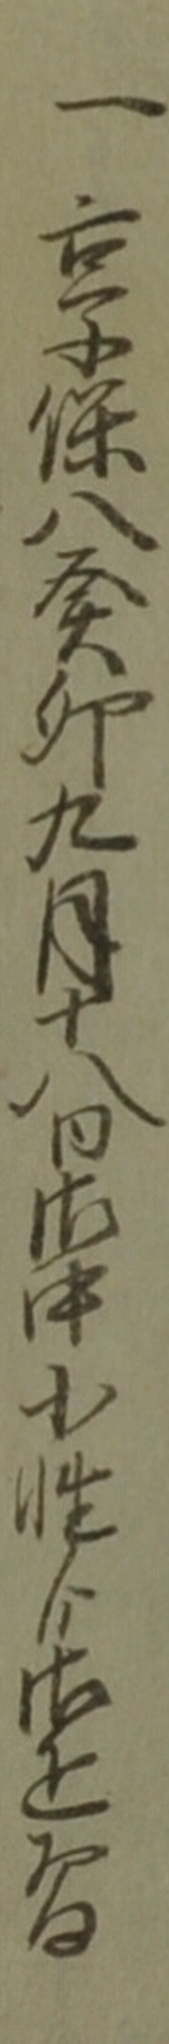一享保八癸卯九月十八日御中小性ゟ御近習
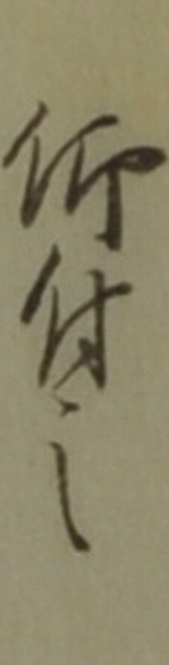仰付之
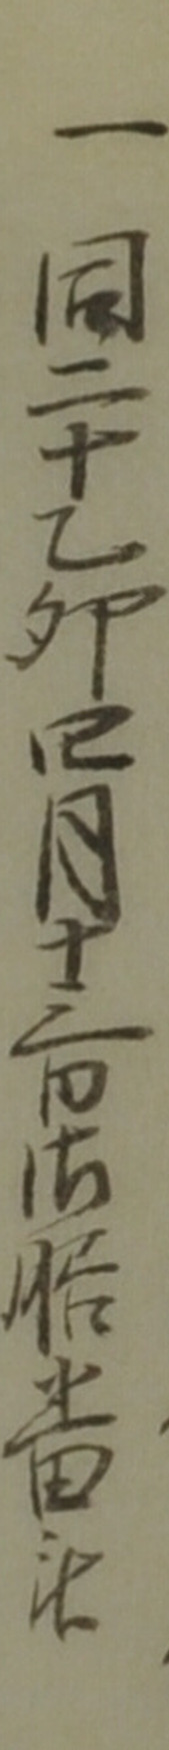一同二十乙卯四月十三日御膳番被
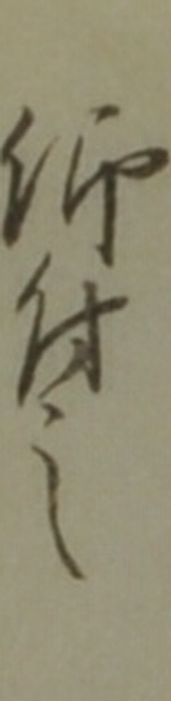仰付之
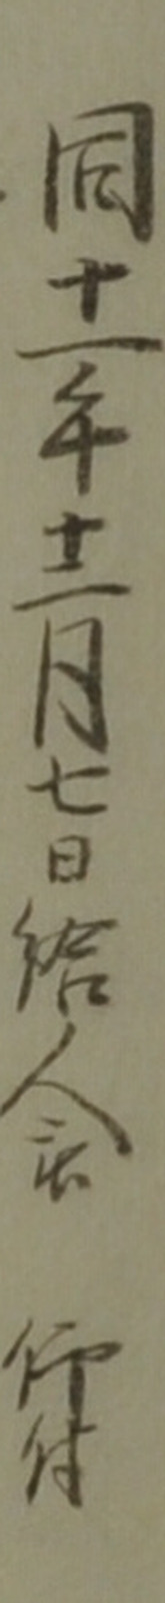同十一午十二月七日給人被仰付
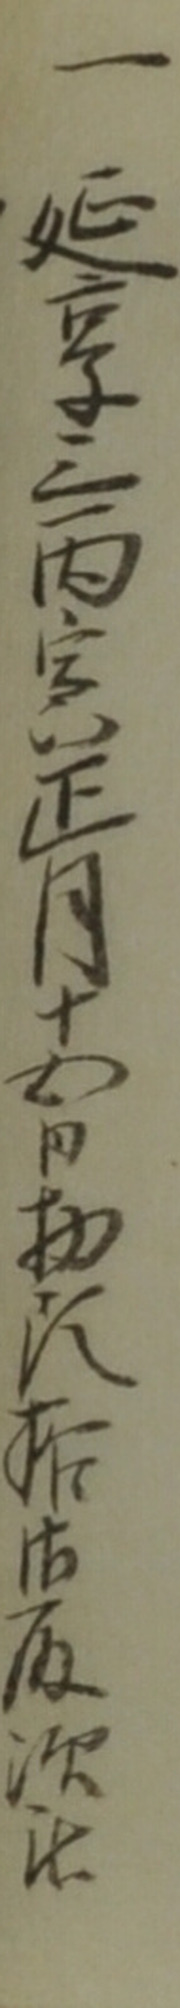一延享三丙寅正月十五日物頭格御取次被
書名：諸御役代々録（五）
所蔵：伊那市立高遠町図書館・合同会社AMANE
